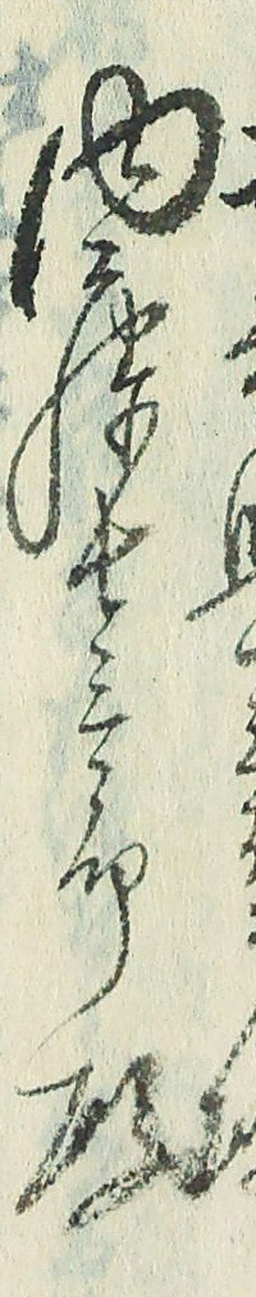内藤長三郎殿
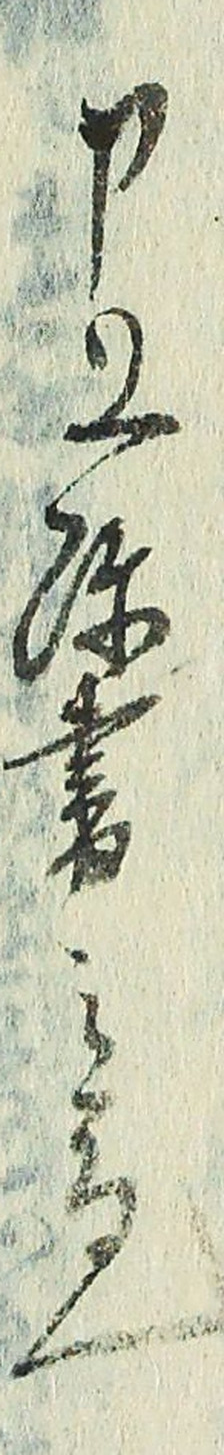申上添書之覚
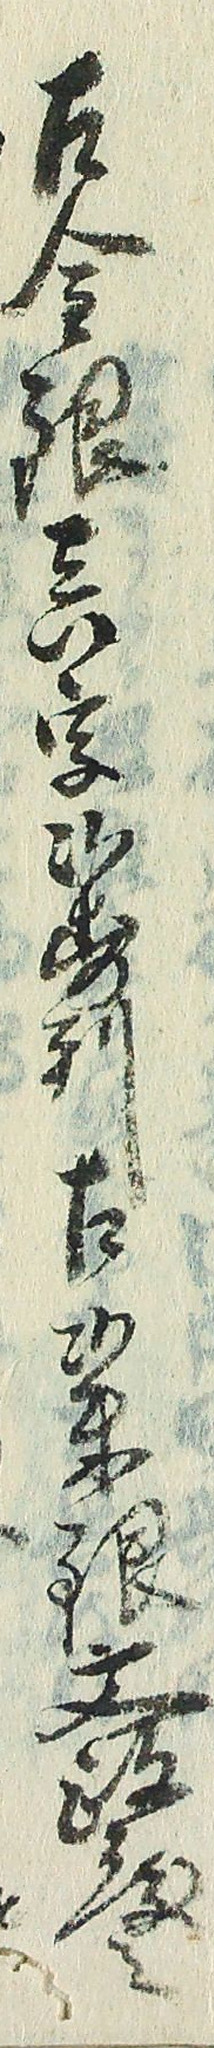古金銀真字弐歩判古弐朱銀文政度之
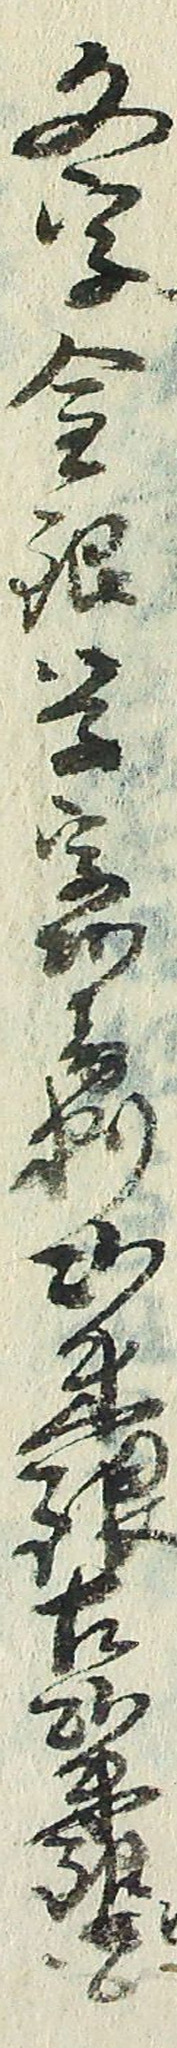文字金銀草字弐歩判弐朱銀古弐朱銀とも
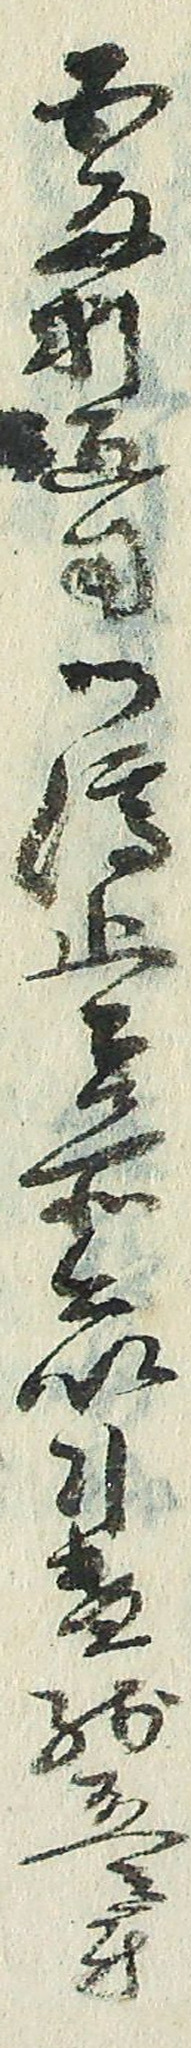五両判通用御停止に候所今以引替残有之に付
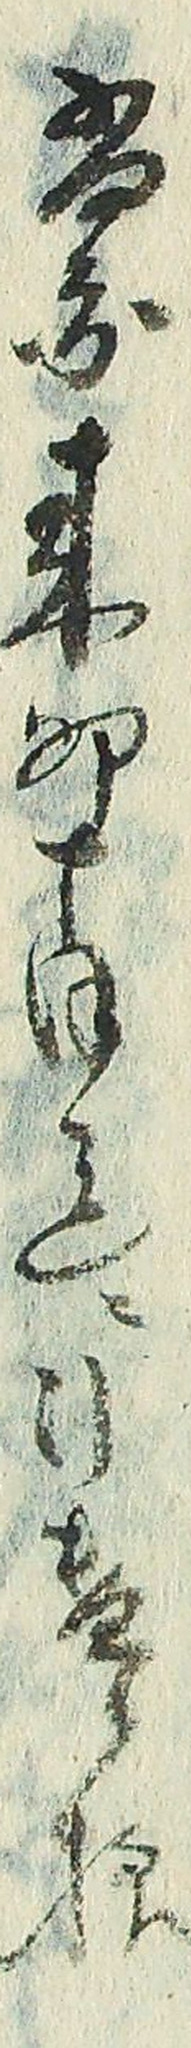尚亦来卯十月迄に引替候様
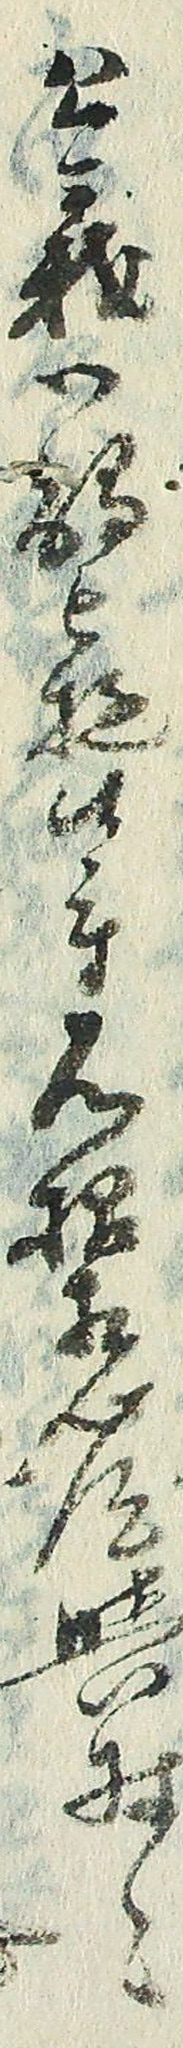公義御触被遊候に付右様相心得与村々
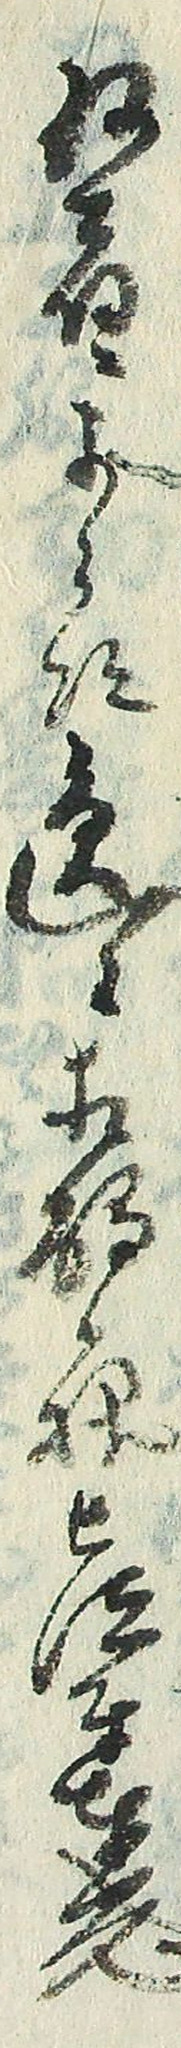何者によらす逸々相触候様被仰付奉畏

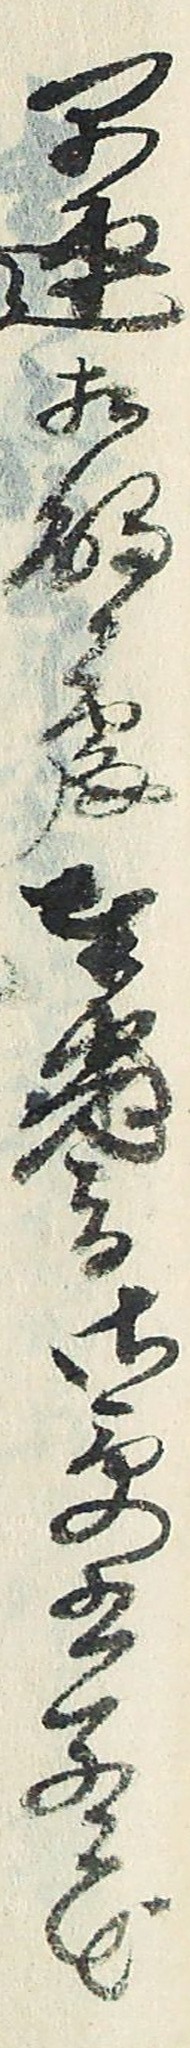早速相触候処奉畏旨御受書差出
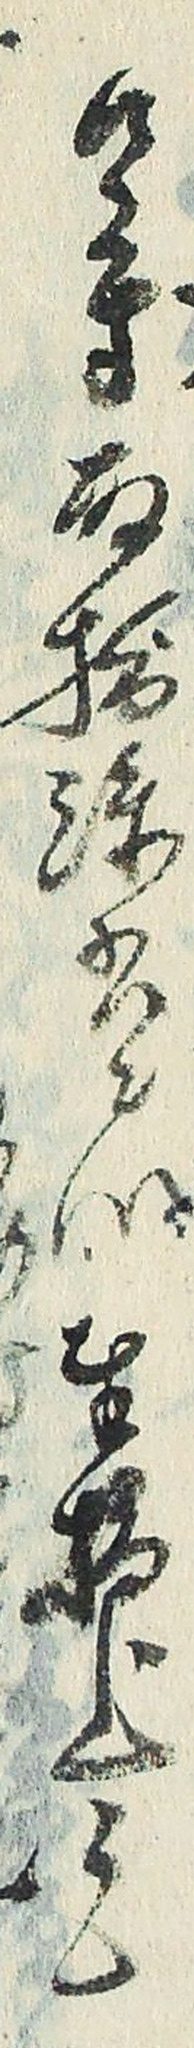候に付取揃添書を以奉指上候い以上
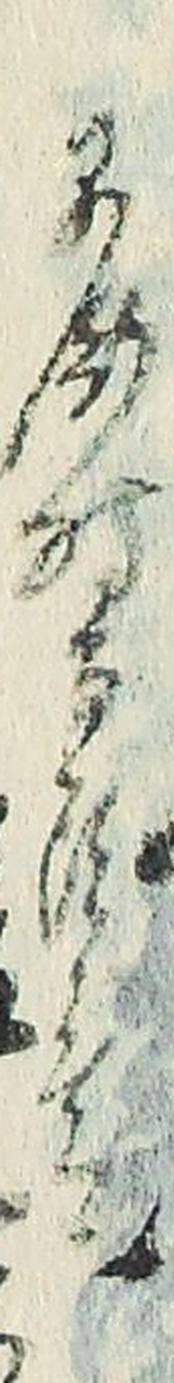早淵村与頭庄屋
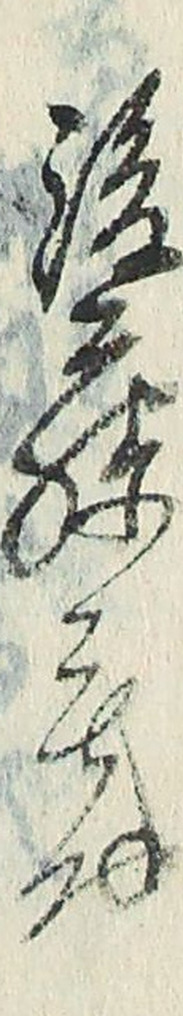後藤庄助
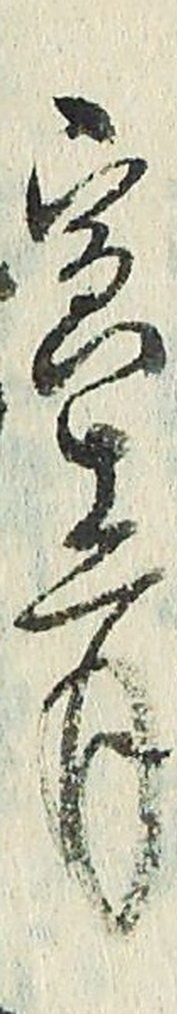寅十二月
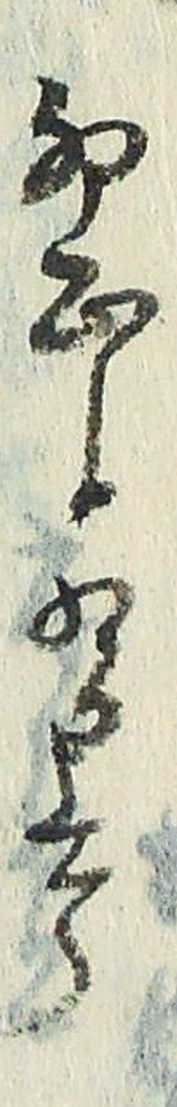卯正月九日上ケ
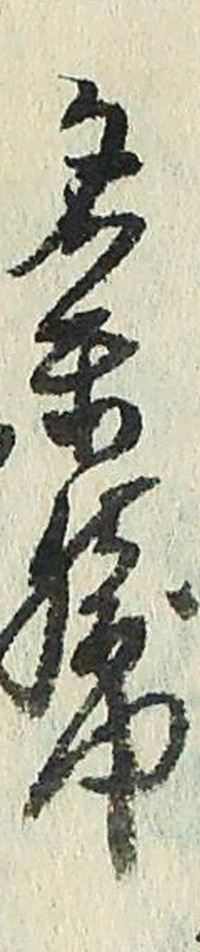名東勝浦
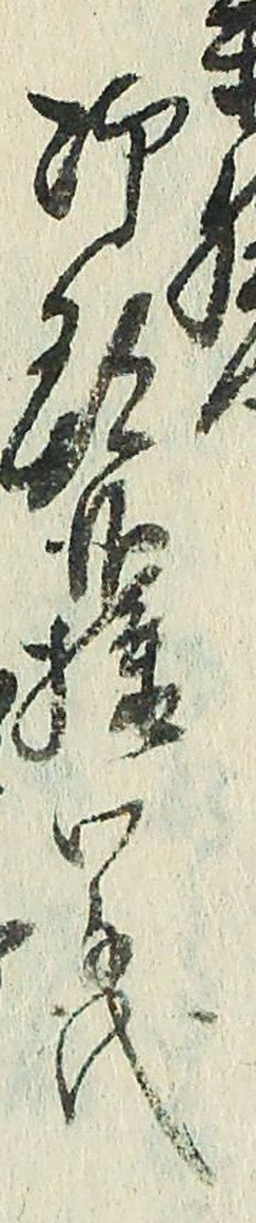御郡代様御手代
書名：諸御用御□受書控
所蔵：鳴門教育大学 Naruto University of Education
